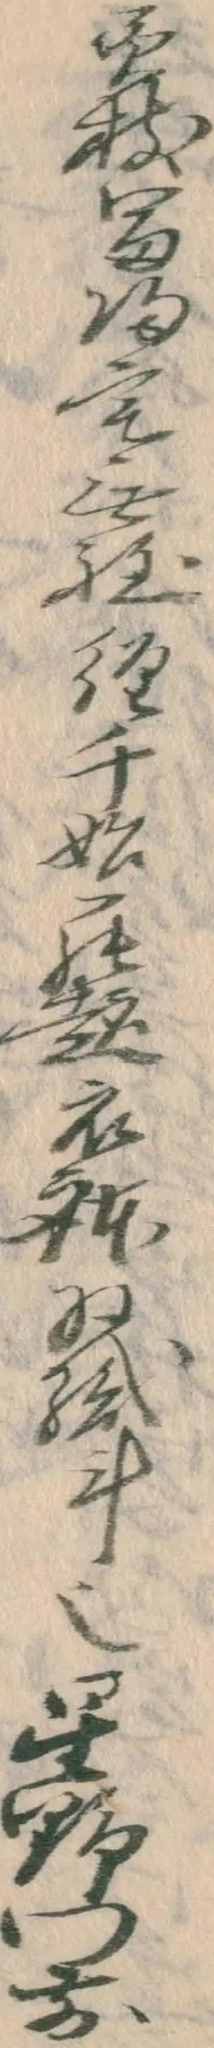美枝冨帰宅無程経千始罷越衣躰羽織斗也星野門前
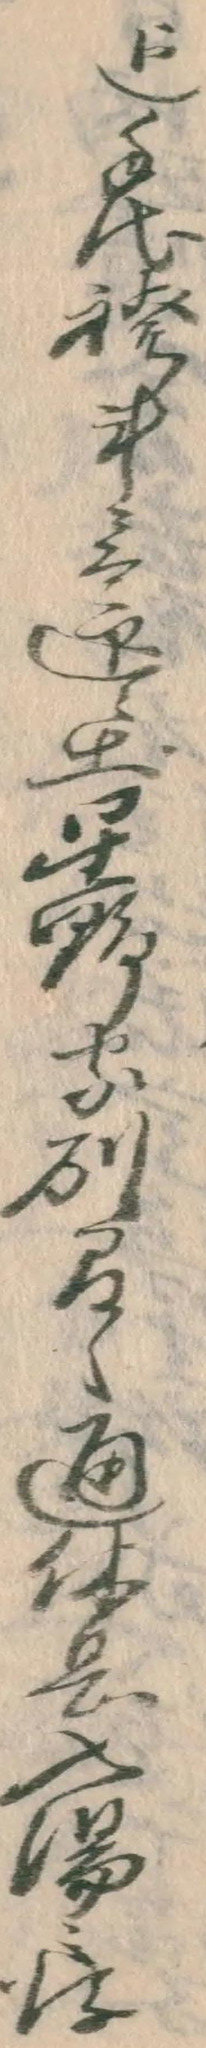迄手代袴斗ニ而迎ニ出星野家別間之通休息入湯之後
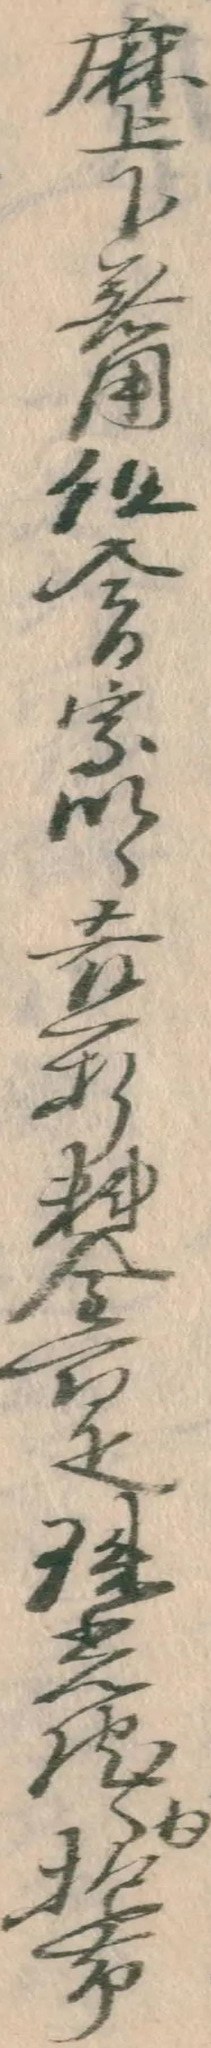麻上下着用但今日宗以へ肴一折料金百疋珠光院へ白抱帯
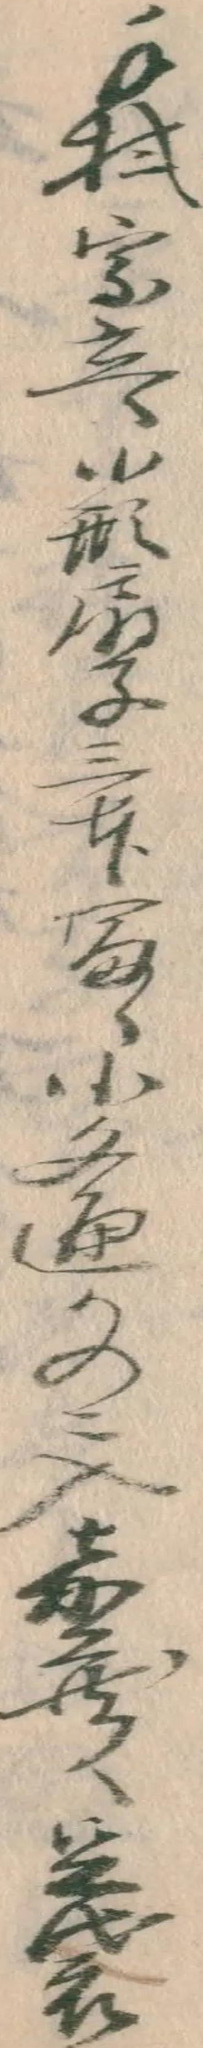手拭家立候小形扇子三本冨へ小文通かのこ入嘉蔵へ足袋
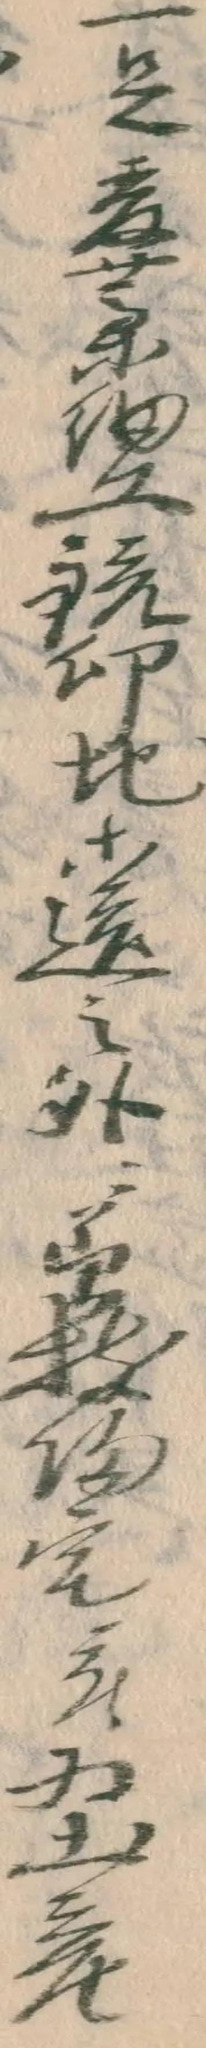一足麦藁紬工統印地等送之外ニ美枝帰宅ニ付為土産
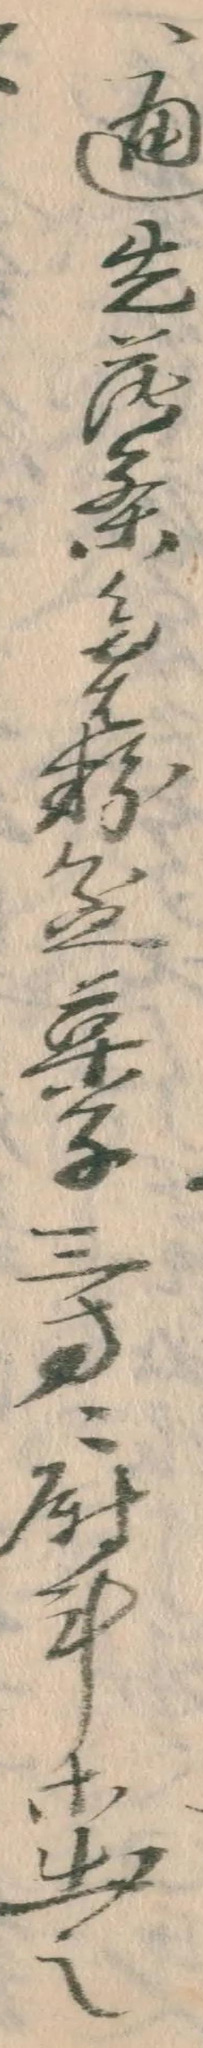へ通先薄茶たは粉盆菓子三方二尉斗等出之
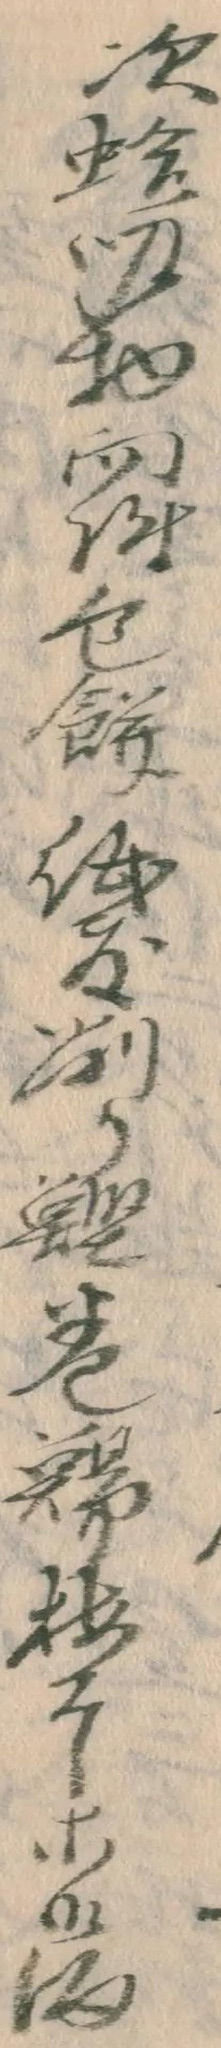次蛤吸物向附包餅紙敷削り鰹巻鯣梅ほし等御酒
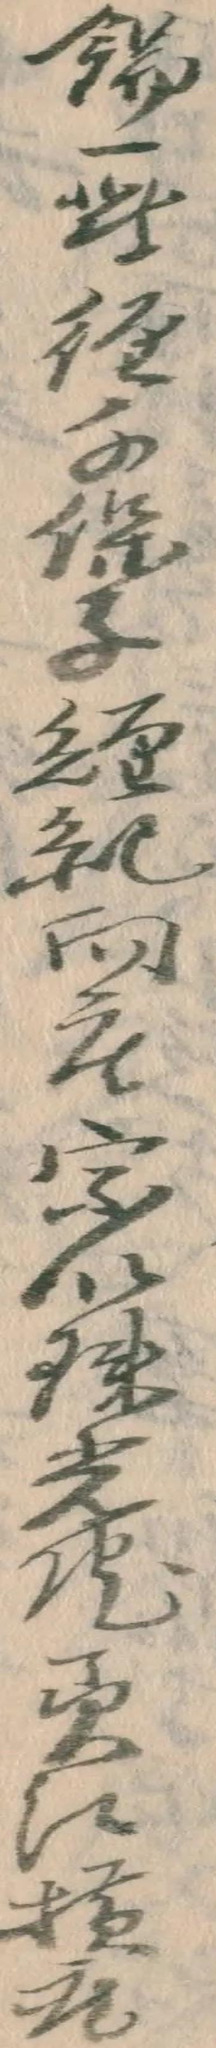錫一對経千保子経紀向座宗以珠光院美江横座
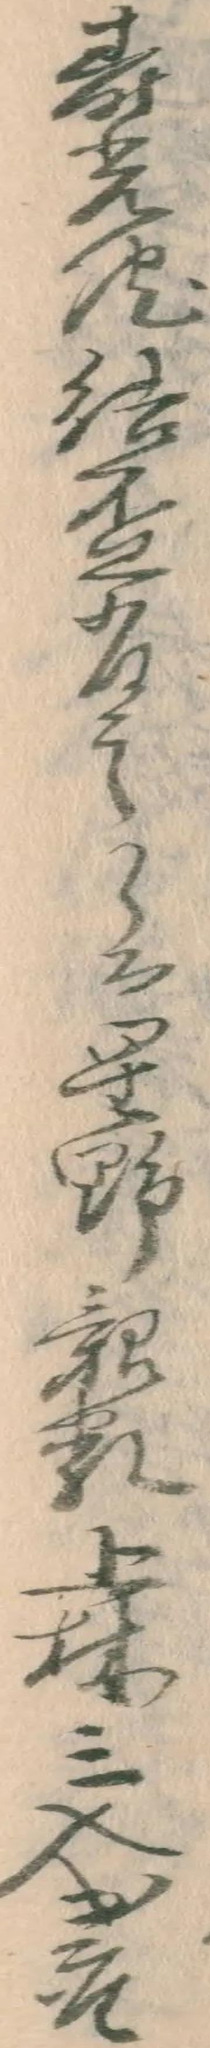壽光院結盃有之了而星野親類上林三入出座
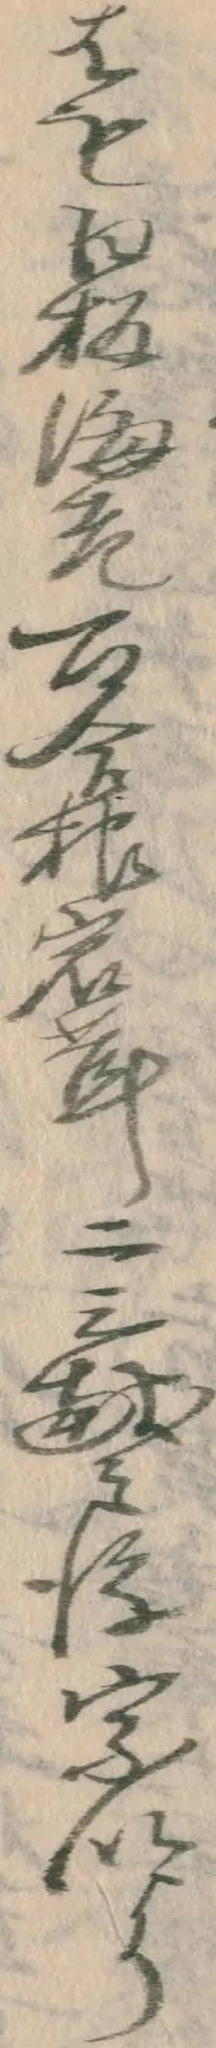はも白板海老百合根岩茸二三献之後宗以より
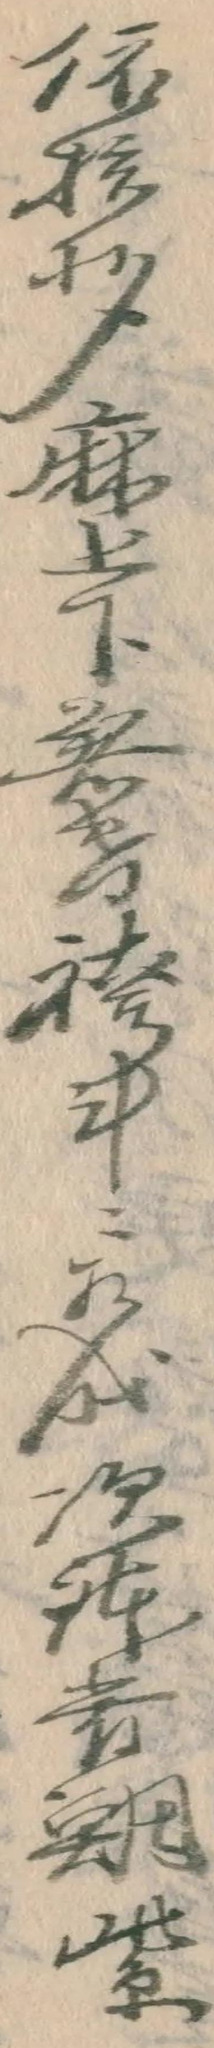依挨拶麻上下着袴斗二相成次鉢肴鯛紫
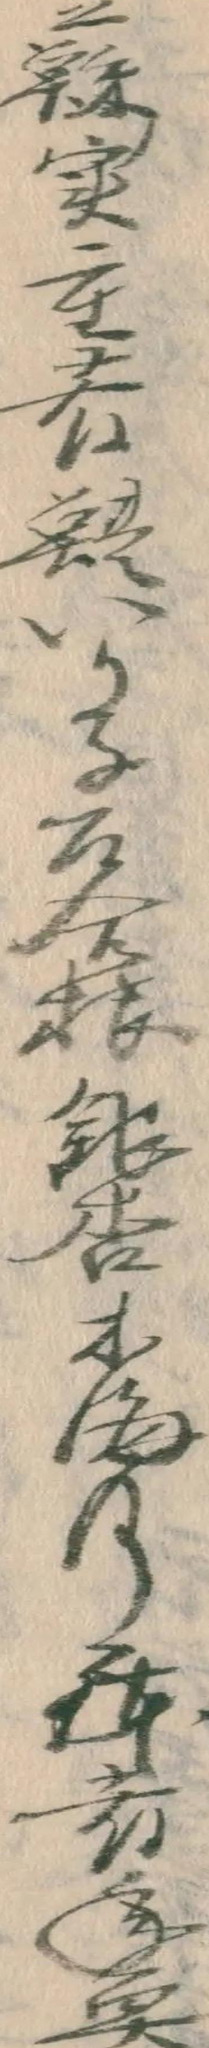蘇実重肴鯵いりこ召合根銀杏木海行鉢肴年魚
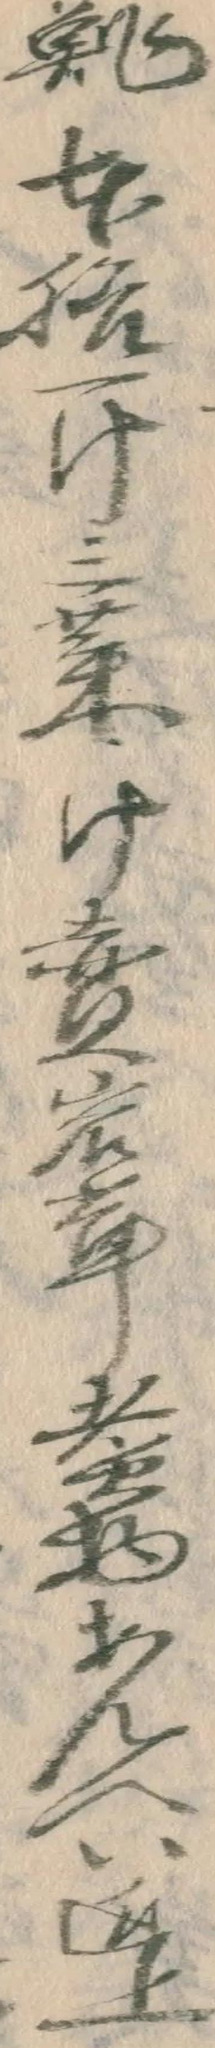鮑本膳一汁三菜汁赤貝岩茸煮物あんへい近上
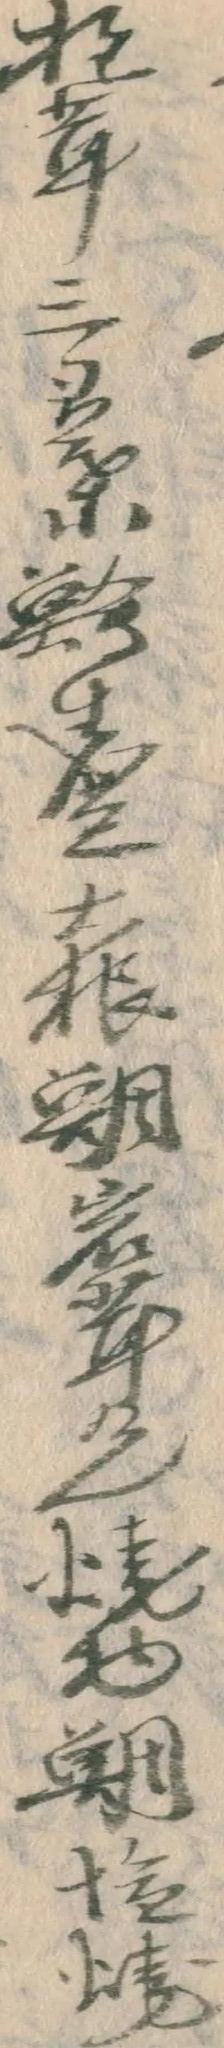柱茸三鱠生盛大根鯛岩茸けん焼物鯛塩焼
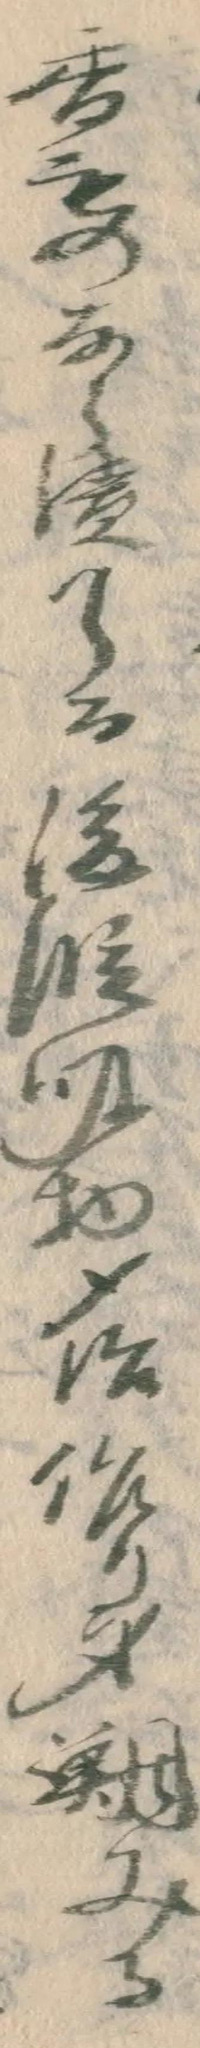香ものなら漬了而後段吸物〆治作り身鯛みる
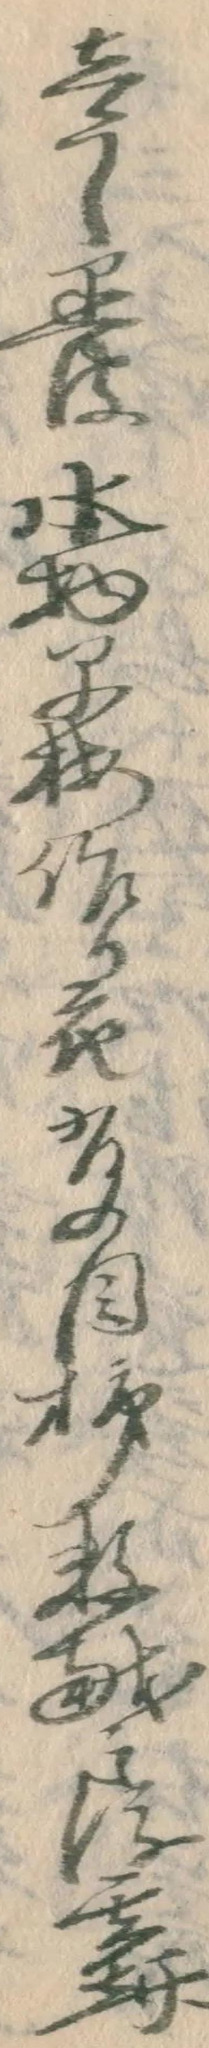すまし後水物早梅作り花有の目柿数献之後亥
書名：賀茂社記録. 第67冊
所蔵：国立国会図書館 National Diet Library, JAPAN
